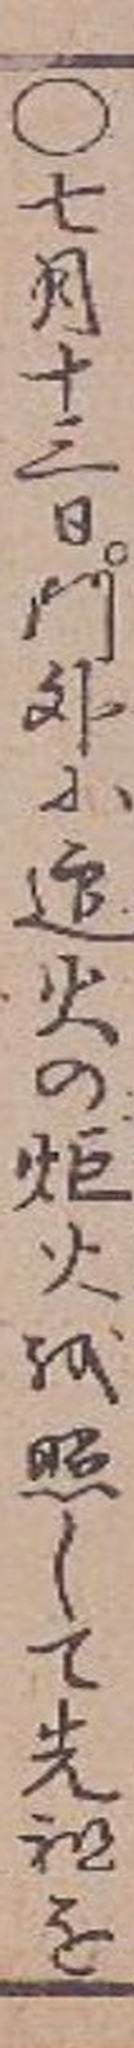〇七月十三日。門外に迎火の炬火を照して先祖を
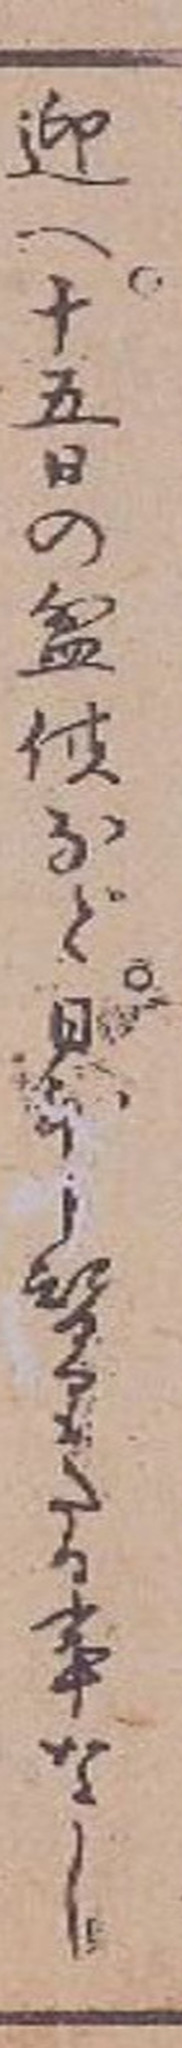迎へ。十五日の盆供など。日本と替りたる事なし
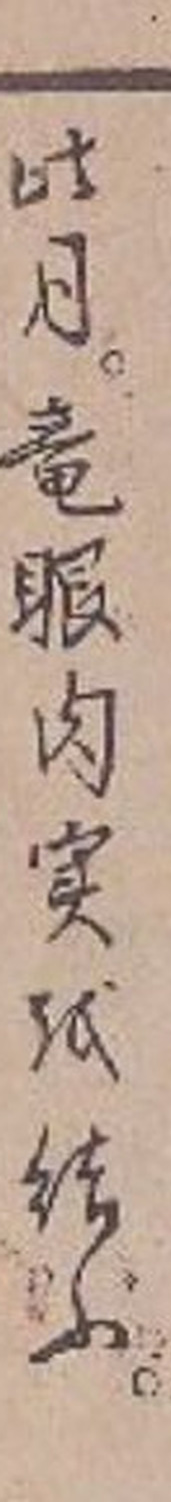此月竜眼肉実を結ぶ。
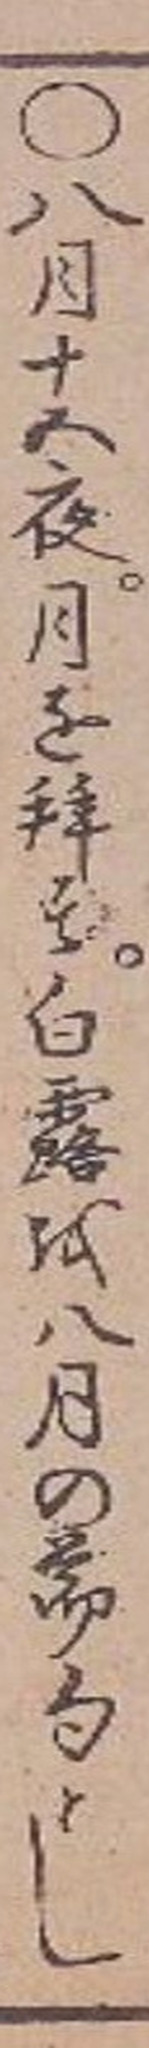〇八月十五夜。月を拝す。白露を八月の節句とし
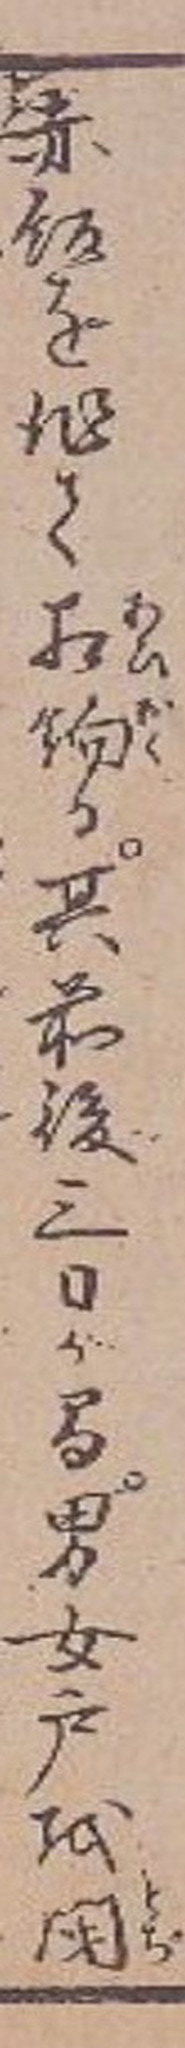赤飯を作て相餉る。其前後三日が間。男女戸を閉
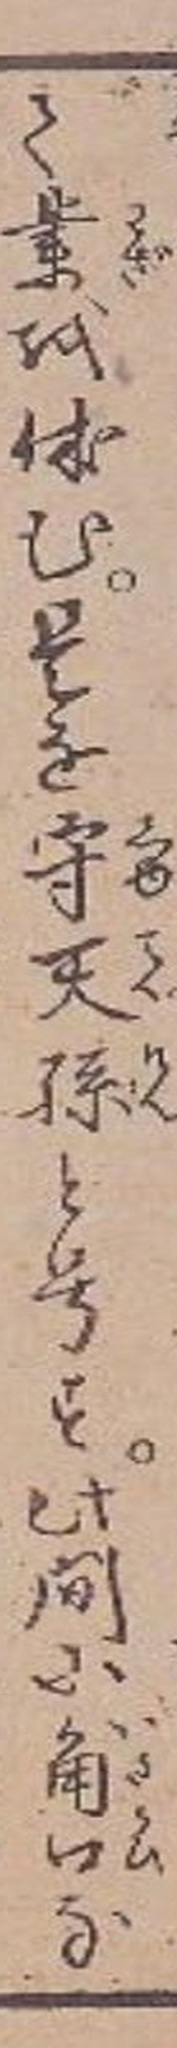て業を休む。是を守天孫と号す。此間に角口な
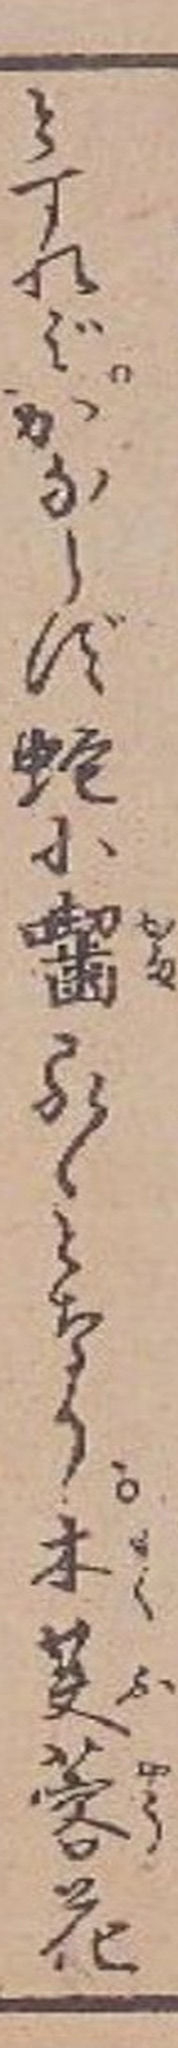とすれば。かならず蛇に囓るゝとなり。木芙蓉花
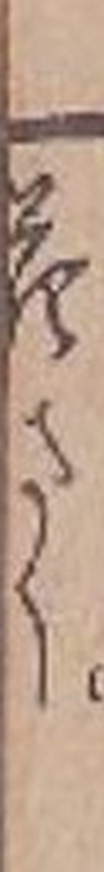花さく。
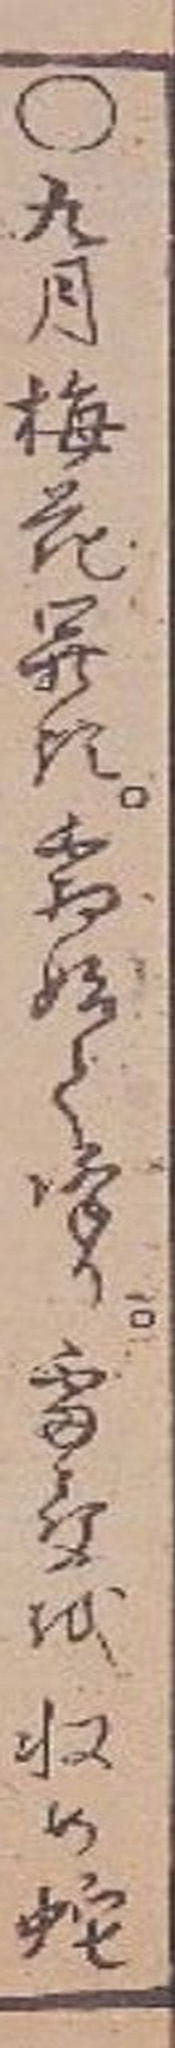〇九月梅花開き。霜始て降り。雷声を収め蛇
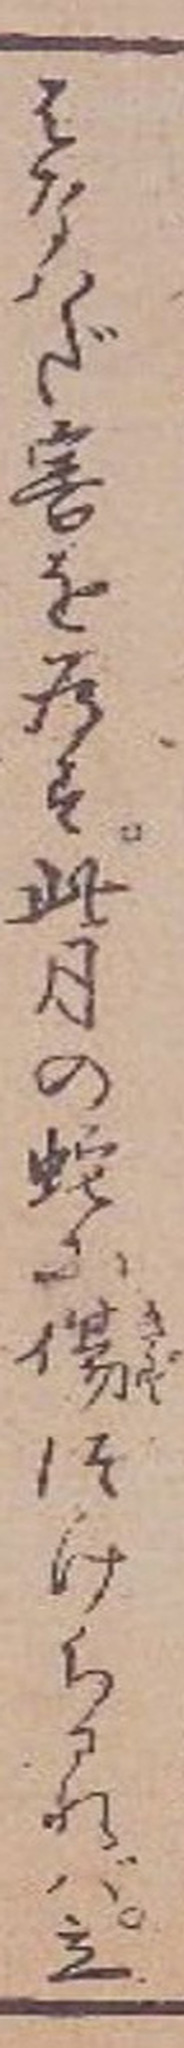はなはだ害を為す。此月の蛇に傷つけらるれば。立
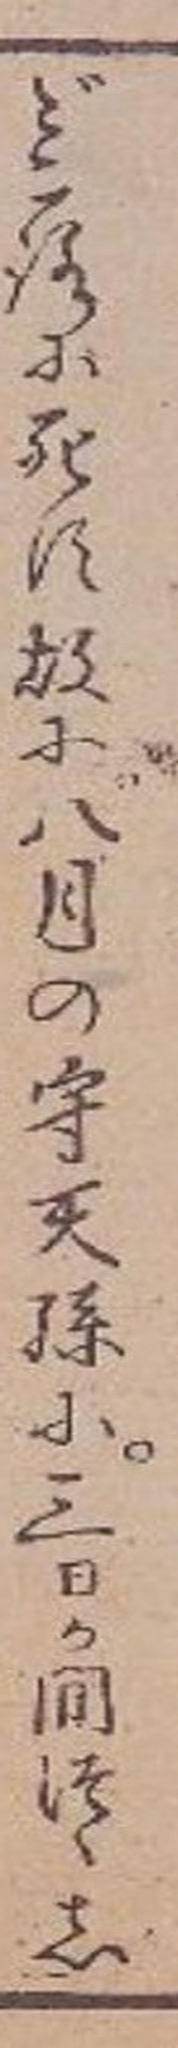どころに死す故に。八月の守天孫に。三日か間つゝし
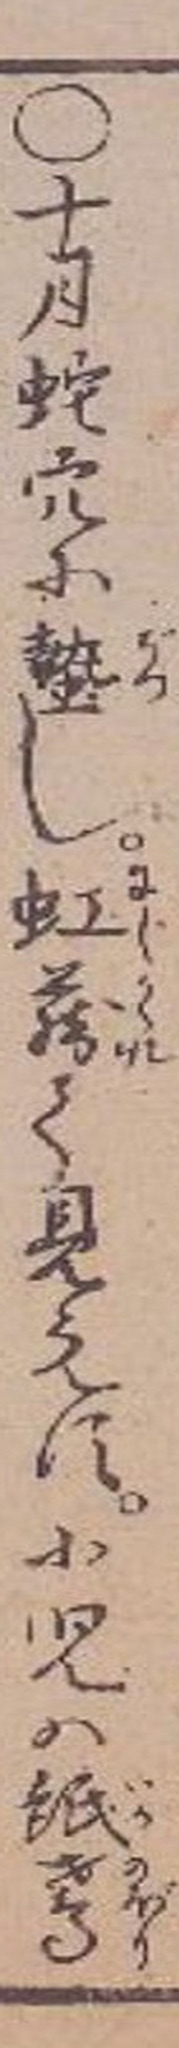〇十月蛇穴に蟄し。虹蔵て見えす。子児は紙鳶
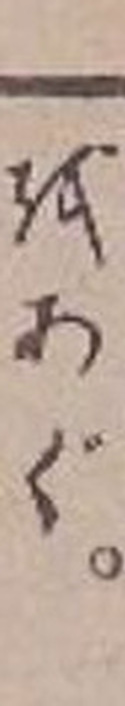をあぐ。
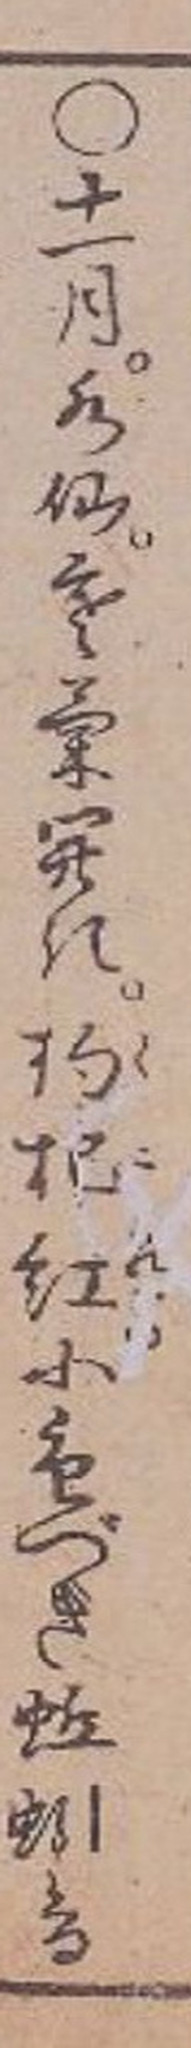〇十一月。水仙。寒菊開き。枸杞紅に色づき蚯蚓音
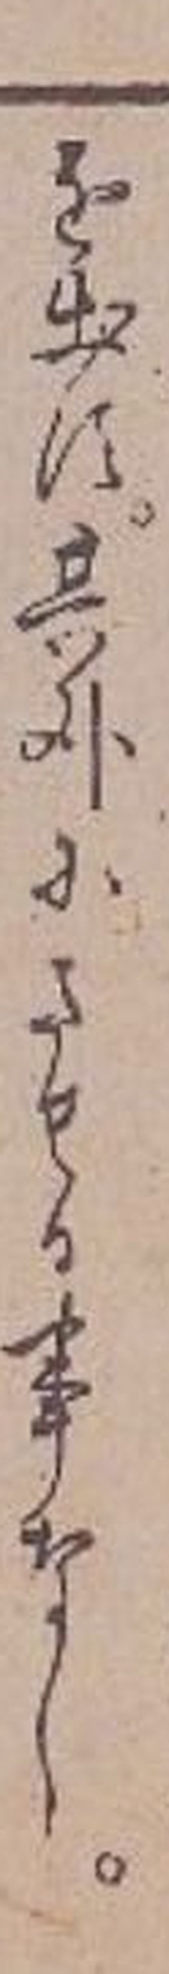を出す。其外にさせる事なし。
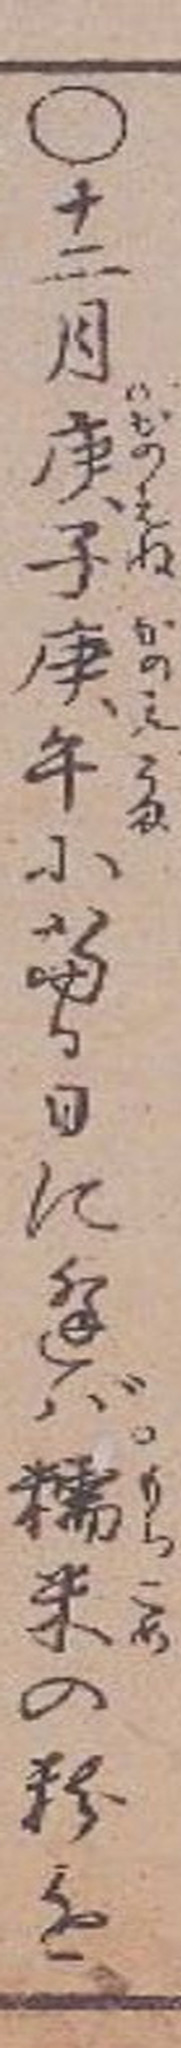〇十二月庚子庚午に当る日に逢ば。糯米の粉を
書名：琉球談
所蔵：University of the Ryukyus Library
